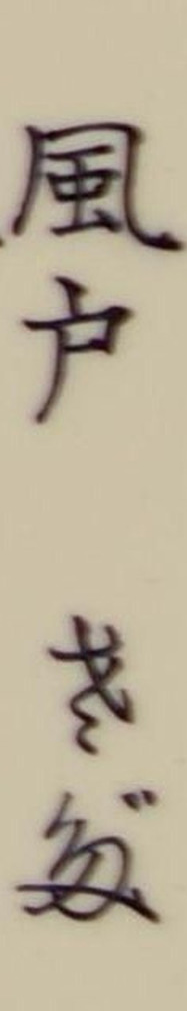風戸さだ
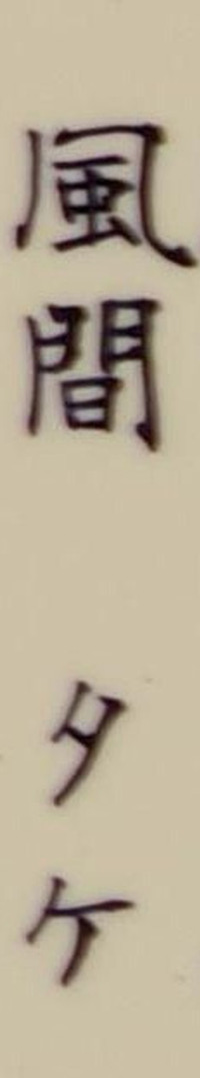風間夕ケ
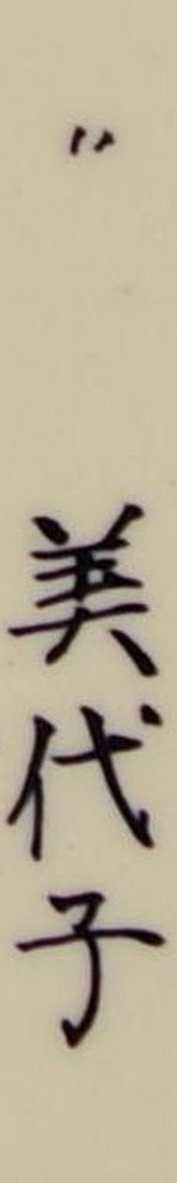美代子
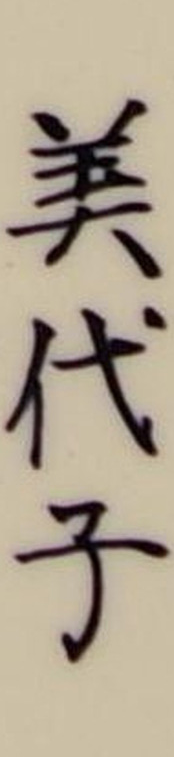美代子
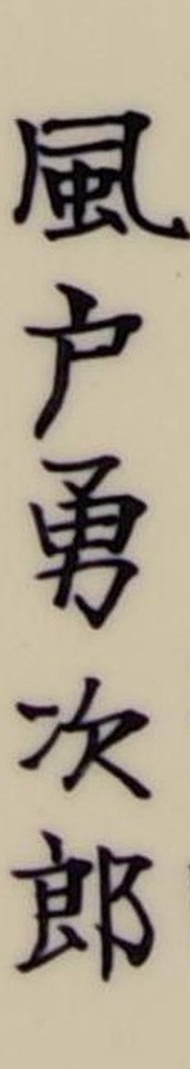風戸勇次郎
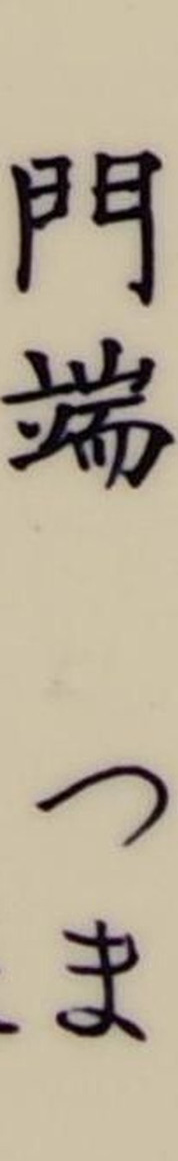門端つま
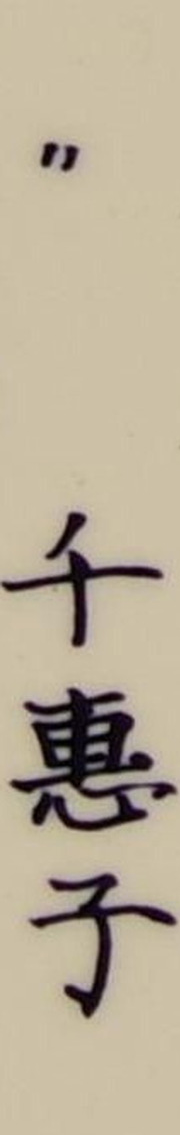千惠子
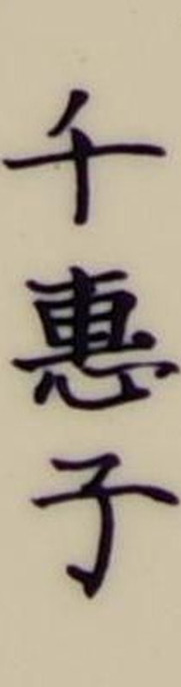千惠子
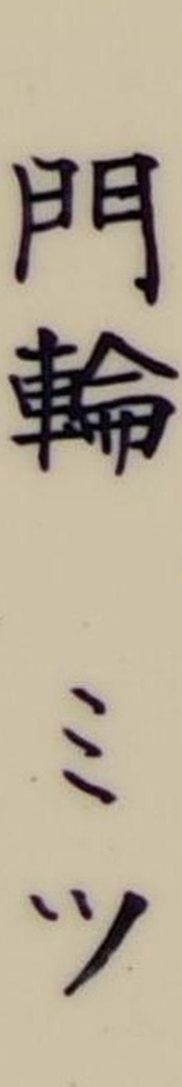門輪ミツ
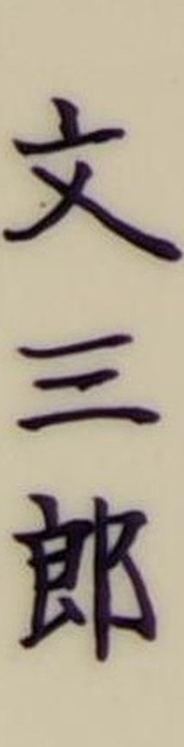文三郎
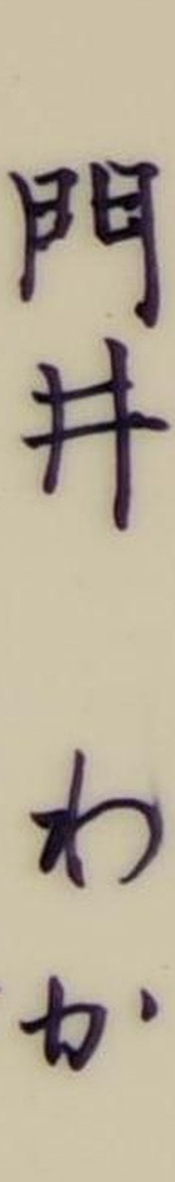門井わか

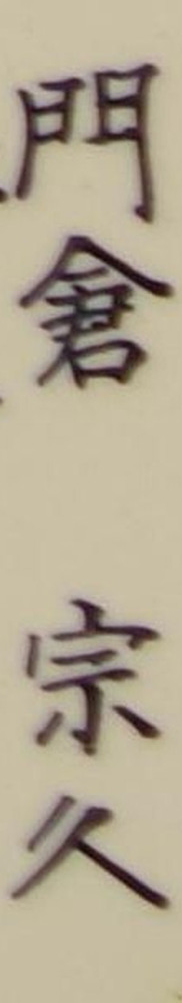門倉宗久
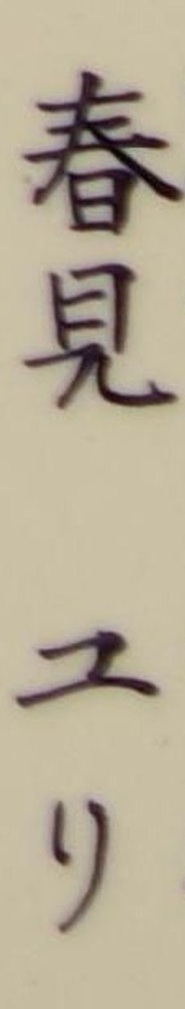春見ユリ
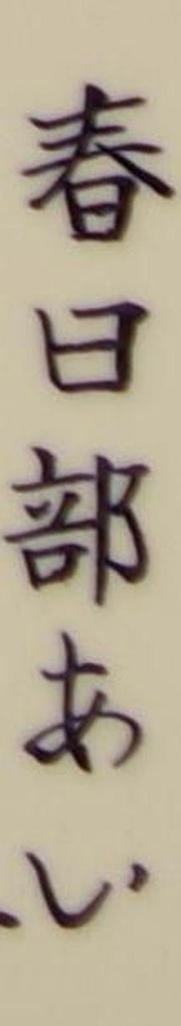春日部あい
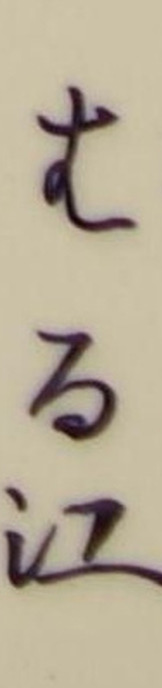はる江
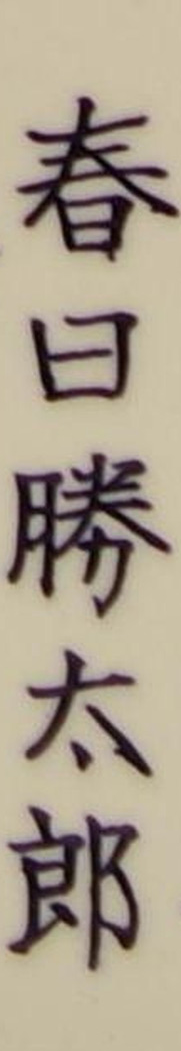春曰勝太郎
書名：E~L
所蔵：高野山金剛峯寺
